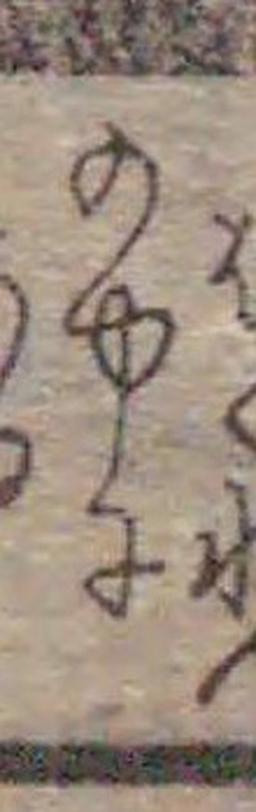の中に
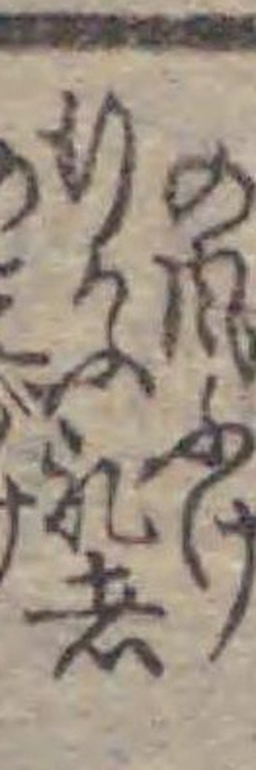行かふ礼者
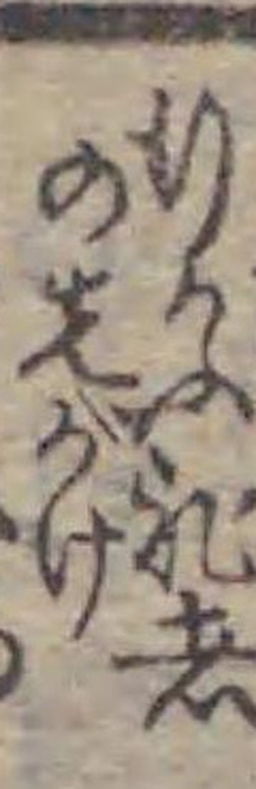の先がけ
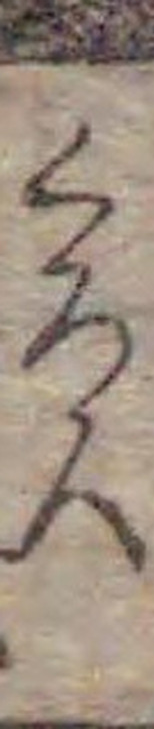くろは
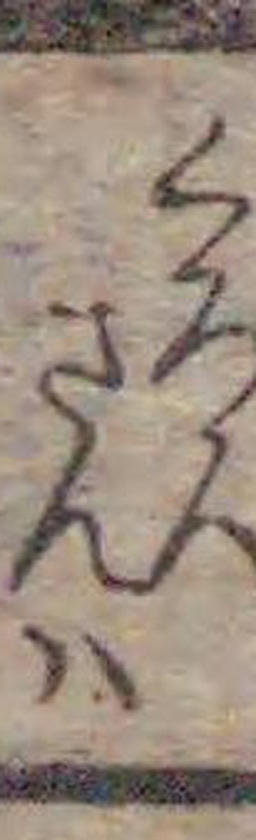さんは
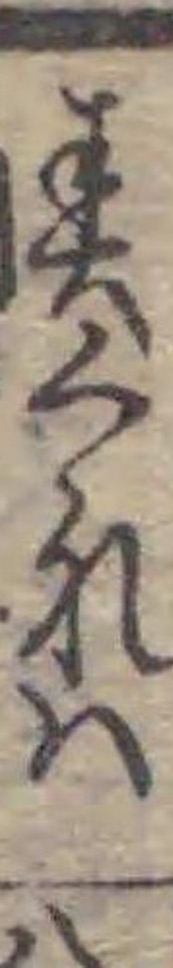春くれは
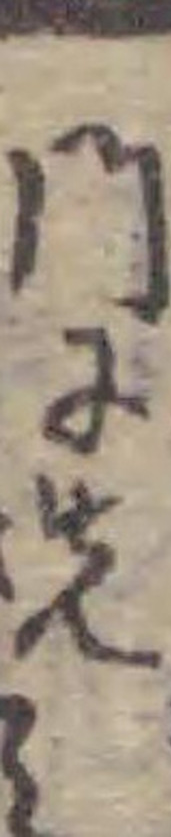門に先
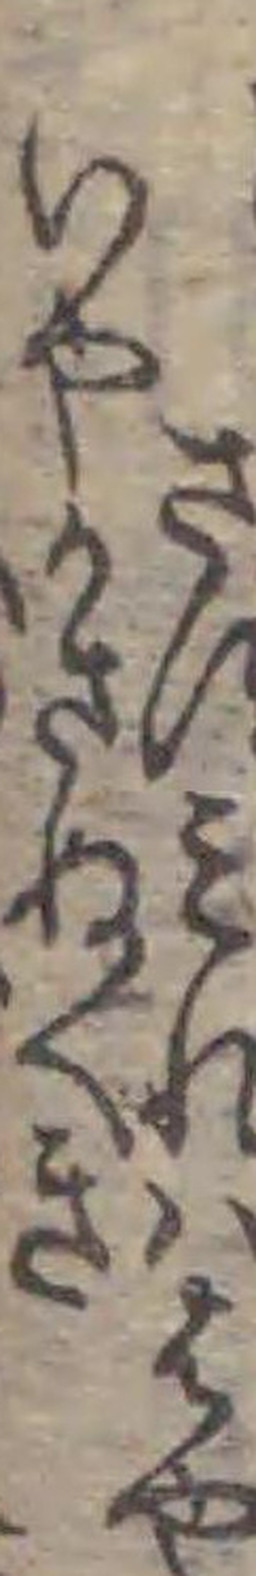いやかさねへき
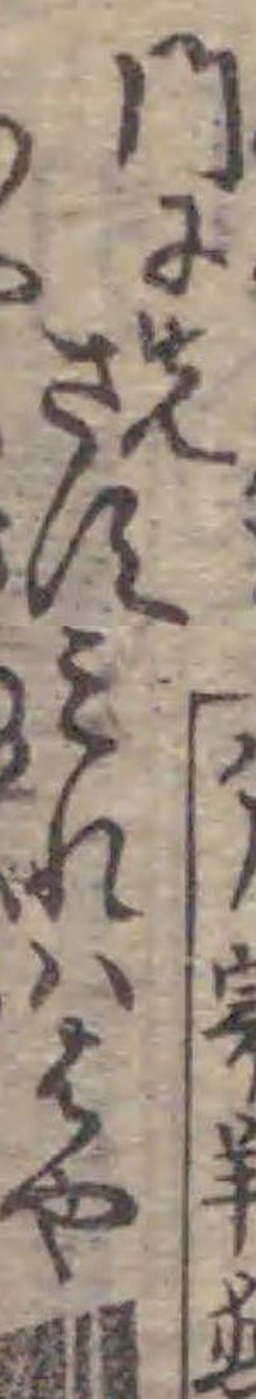さすみれははや
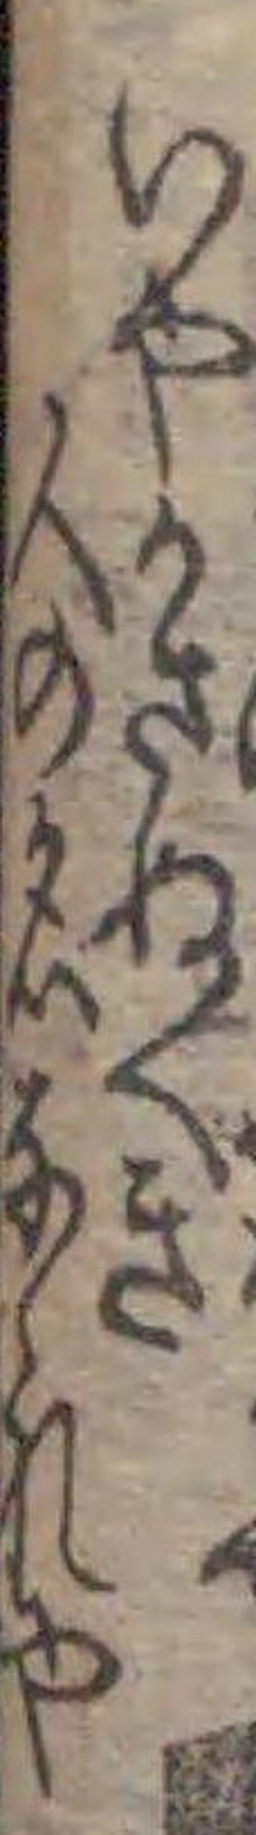人の名なれや
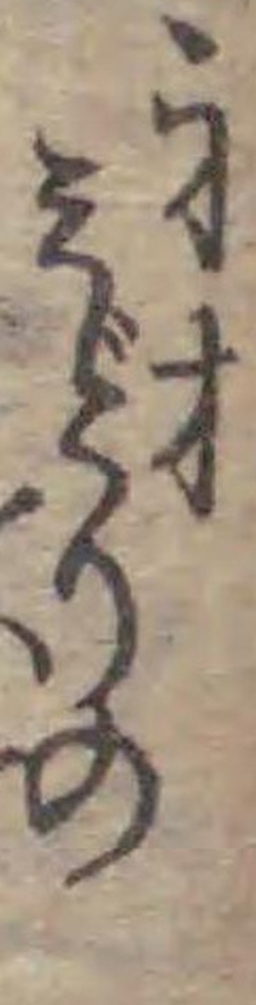みどりの
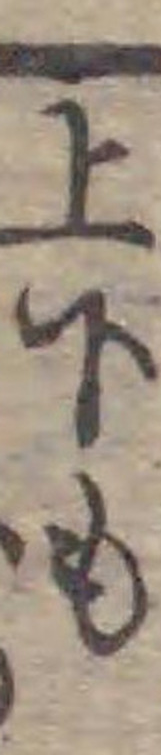上下も
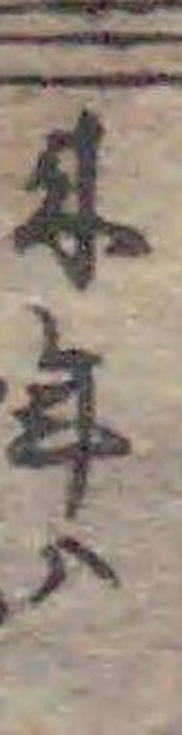来年は
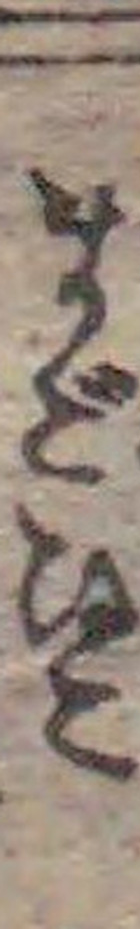まごひこ
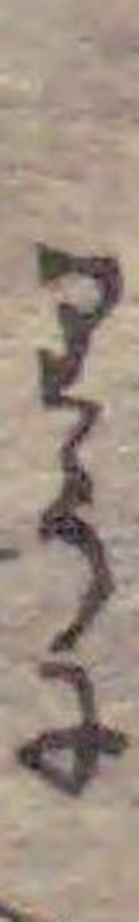りうに
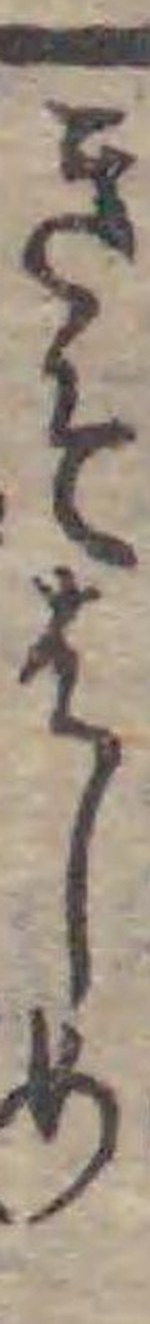きそはしめ
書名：年始御礼帳 : 3巻
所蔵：国立国会図書館 National Diet Library, JAPAN
